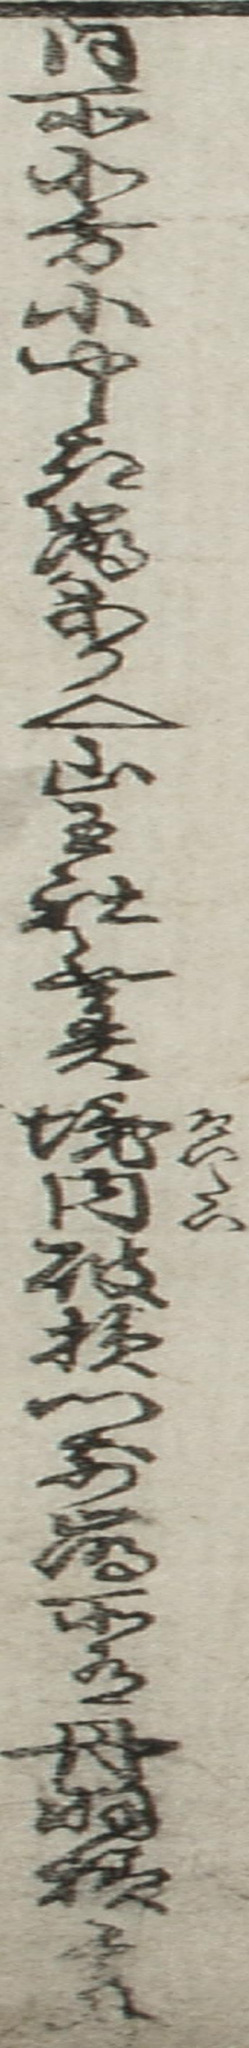同所北方小やしき崩あり△山王社無事境内破損門前崩所有丹羽様其外
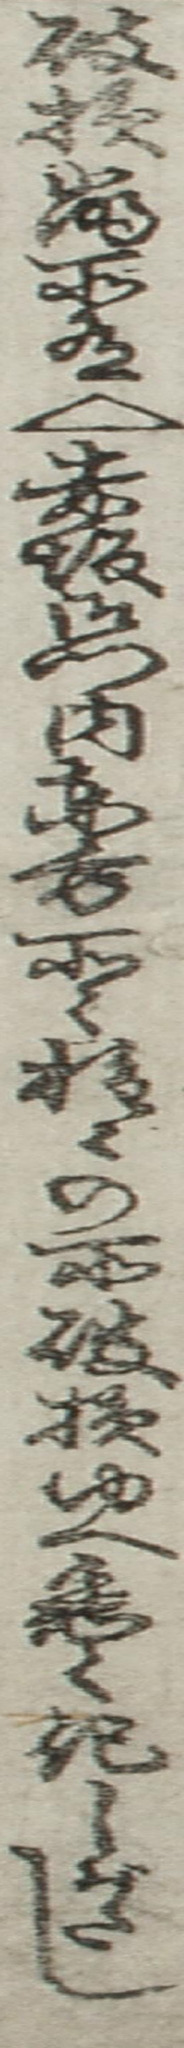破損崩所有△赤坂御門内東方所々種々の所破損ゆへ悉く記しがたし
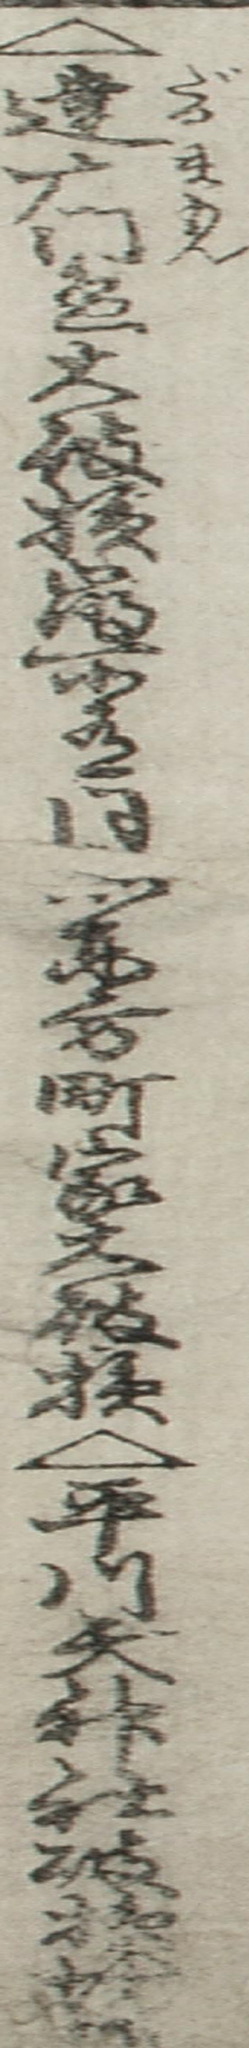△達磨門辺大破損崩所有同所東方町家大破損△平川天神社破損境内

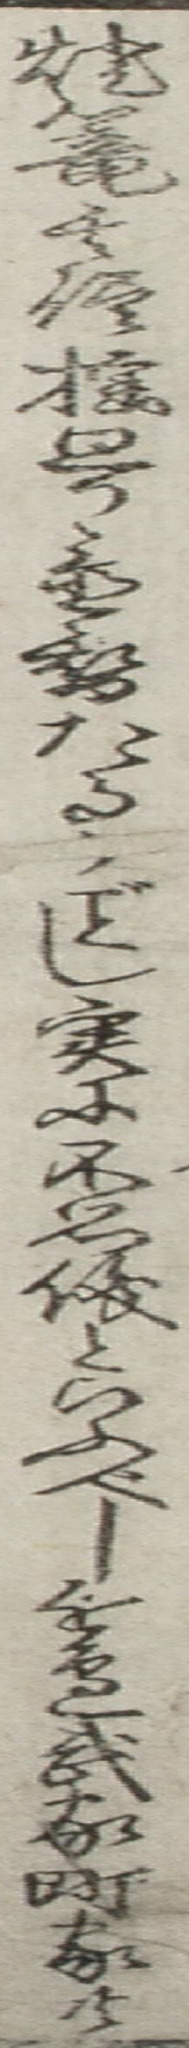燈籠其儘揺廻り置替たるかごとし実に不思儀といふべし近辺武家町家共
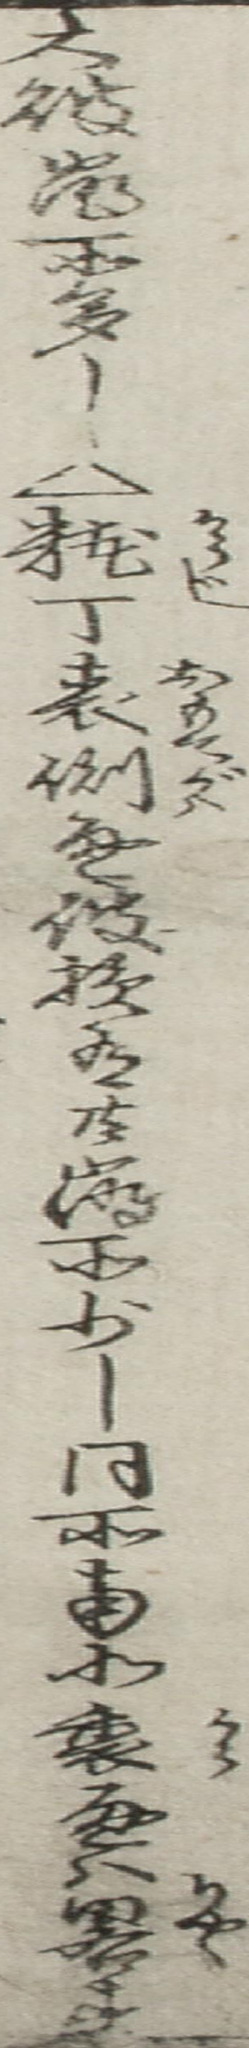大破崩所多し△糀丁表側通破損有共崩所少し同所南北裏通は略す
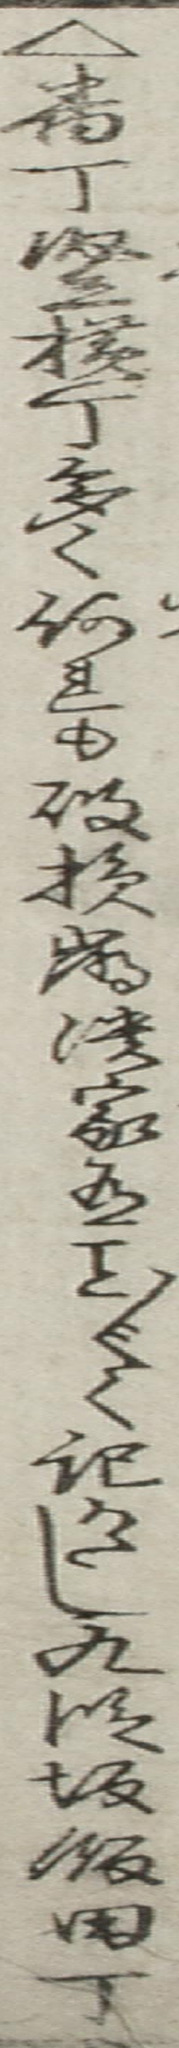△番丁竪横丁多く何れも破損崩潰家有こと〴〵く記かたし九段坂飯田丁
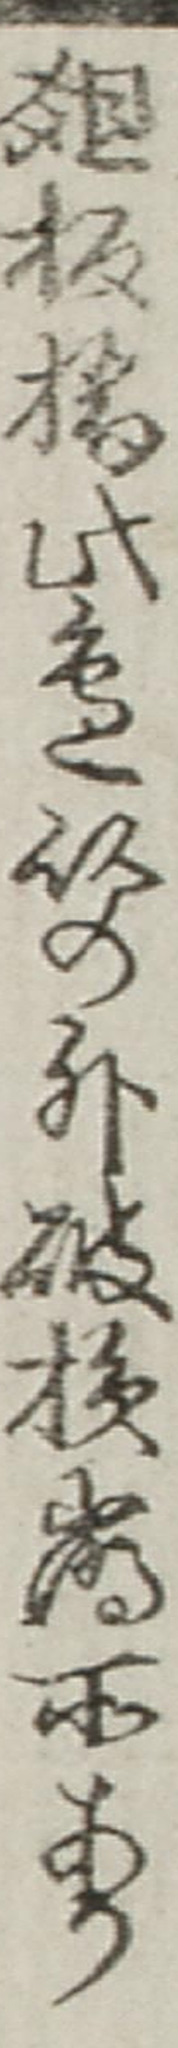俎板橋此辺以の外破損崩所あり
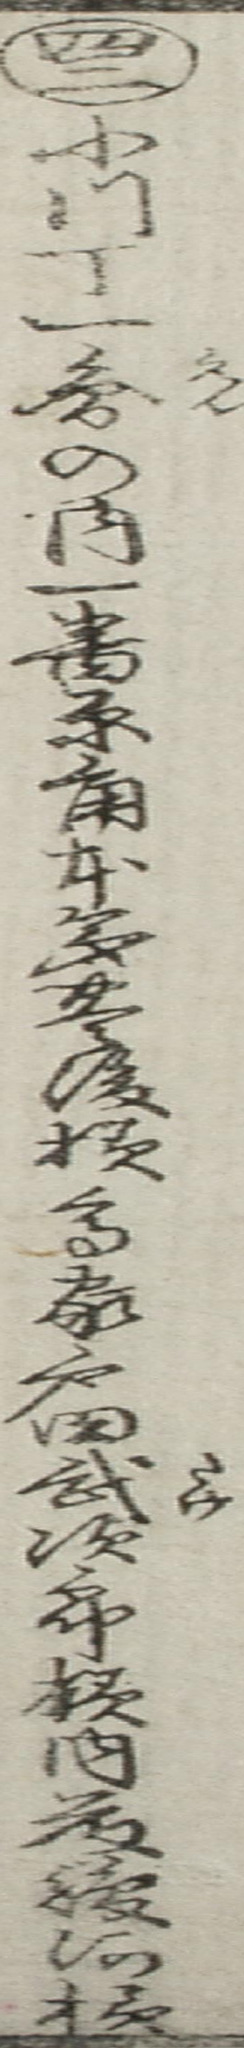小川丁一円の内一番原角本多豊後様高家戸田武次郎様内藤駿河様
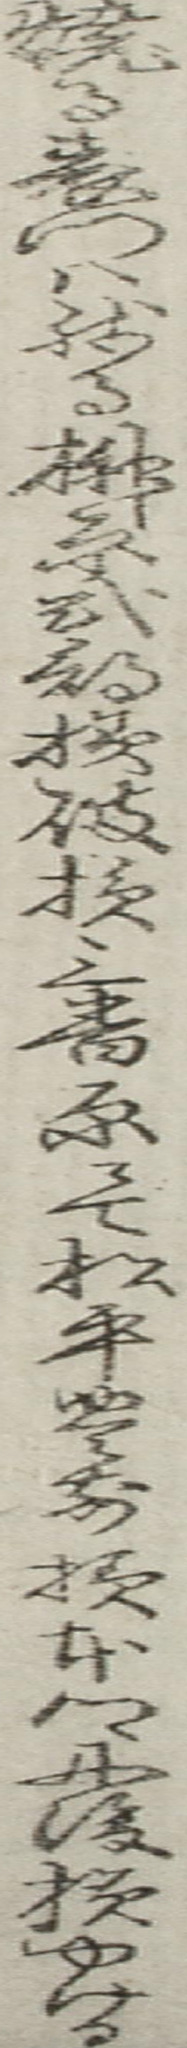焼る表門は残る榊原式部様破損三番原にて松平豊前様本郷丹後様やける
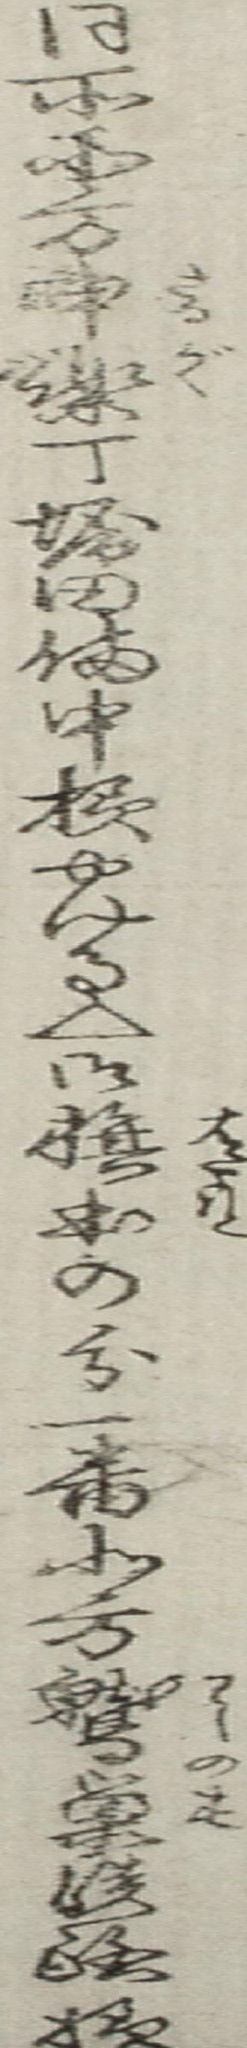同所北方申楽丁堀田備中様やける△御旗本の分一番北方鷲巣淡路様
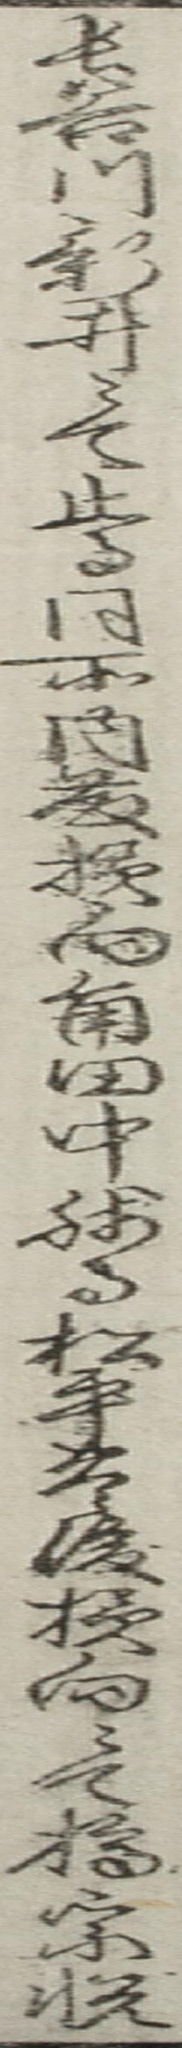長谷川新井にて止る同所内藤様向角田中残る松平豊後様向にて塙宗悦
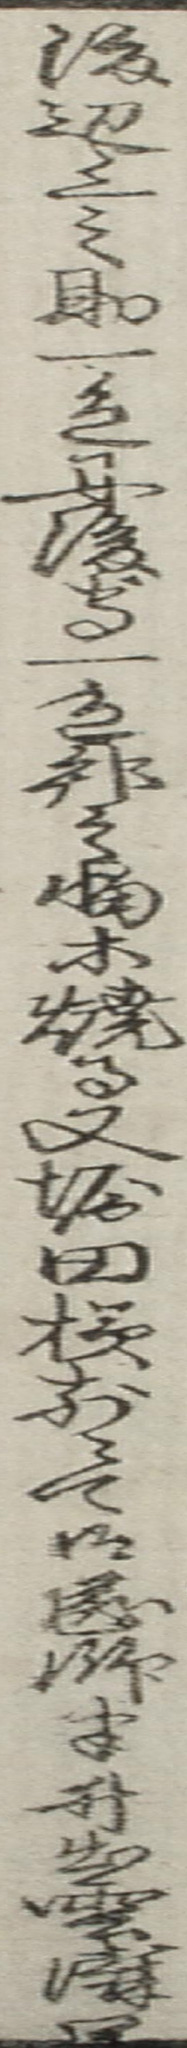渡辺三之助一色丹後守一色邦之輔等焼る又堀田様前にて御医師半井出雲溝口
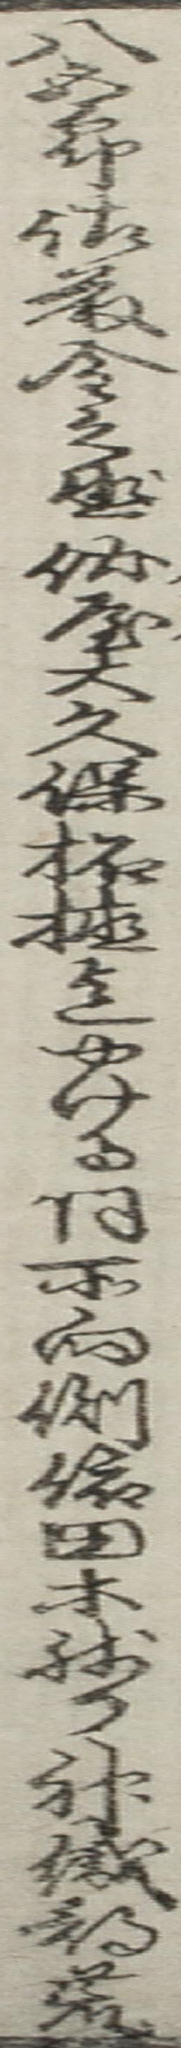八五郎佐藤金之丞伏屋大久保柘植迄やける同所向側依田等残り神識部荒
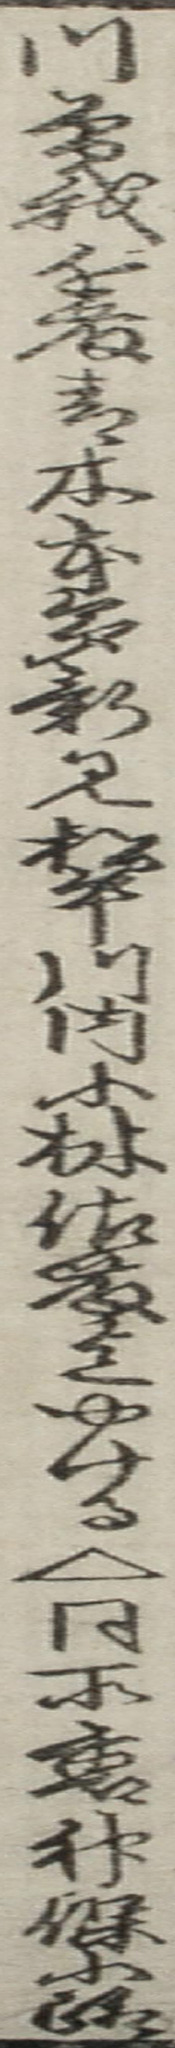川曽我近藤青木本多新見松平川内小林佐藤迄やける△同所裏神保小路
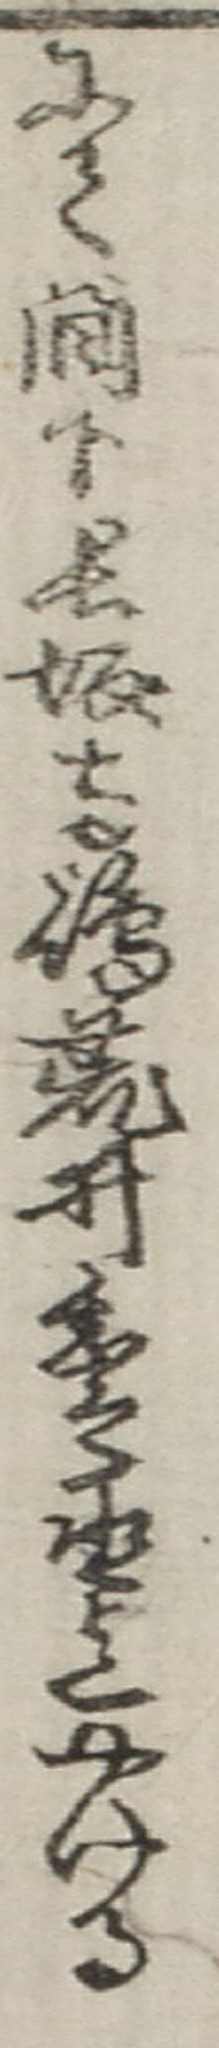にて間下長坂寺嶋荒井真之丞迄やける
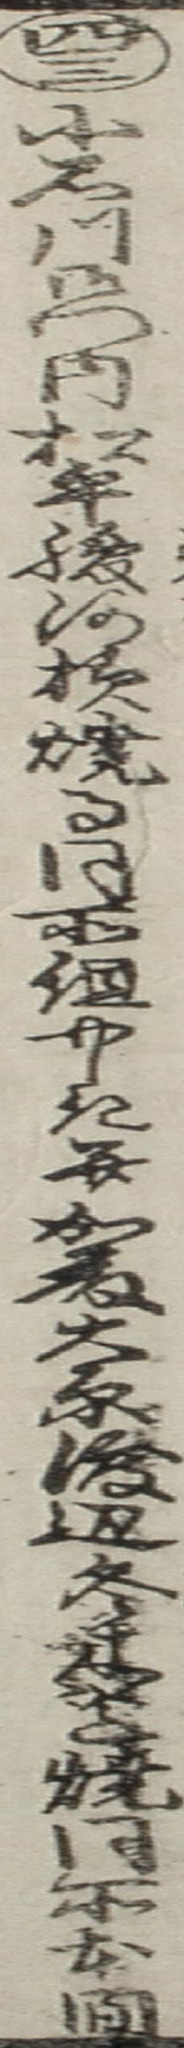小石川御門内松平駿河様焼る同所組やしき幷加藤大原渡辺冬木迄焼同所本間
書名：安政見聞誌　下
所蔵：東京大学地震研究所図書室 Earthquake Research Institute Library, The University of Tokyo, JAPAN
